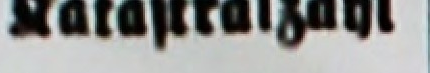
Katastralzahl
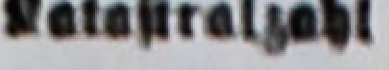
Katastralzahl
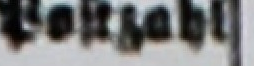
Postzahl
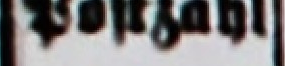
Postzahl
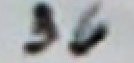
36
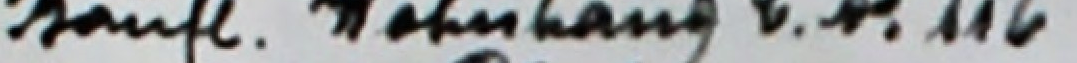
Baufl. Wohnhaus C. No 116
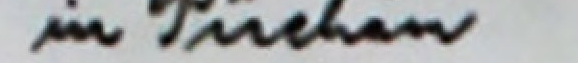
im Puchan
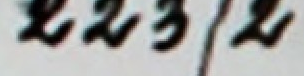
223/2
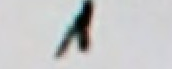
1
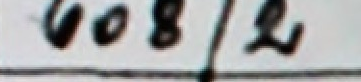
608/2
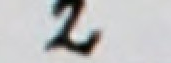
2
